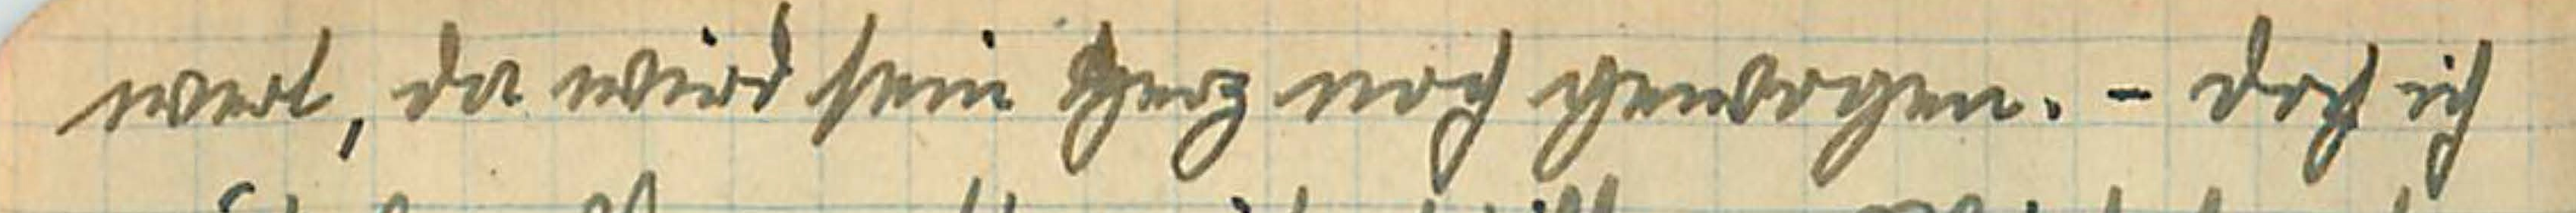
wert, da wird sein Herz noch gewogen. – Doch ich
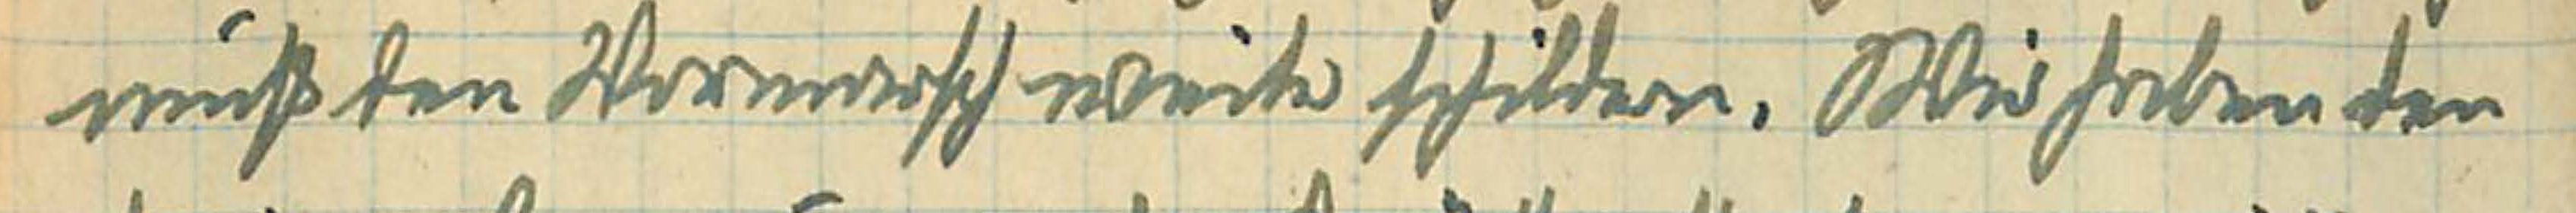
muß den Vormarsch weiter schildern. Wir haben den
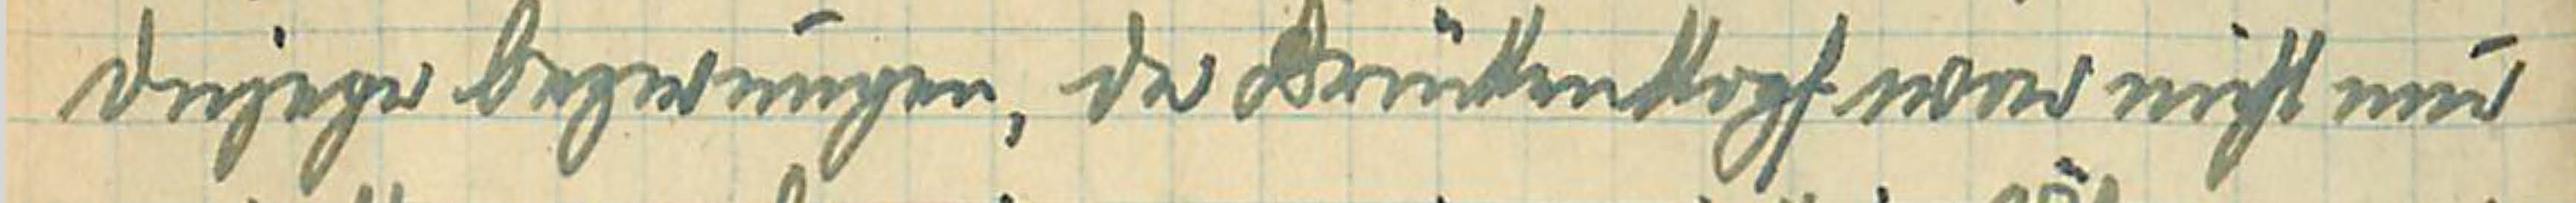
Dnjepr bezwungen, der Brückenkopf war nicht nur
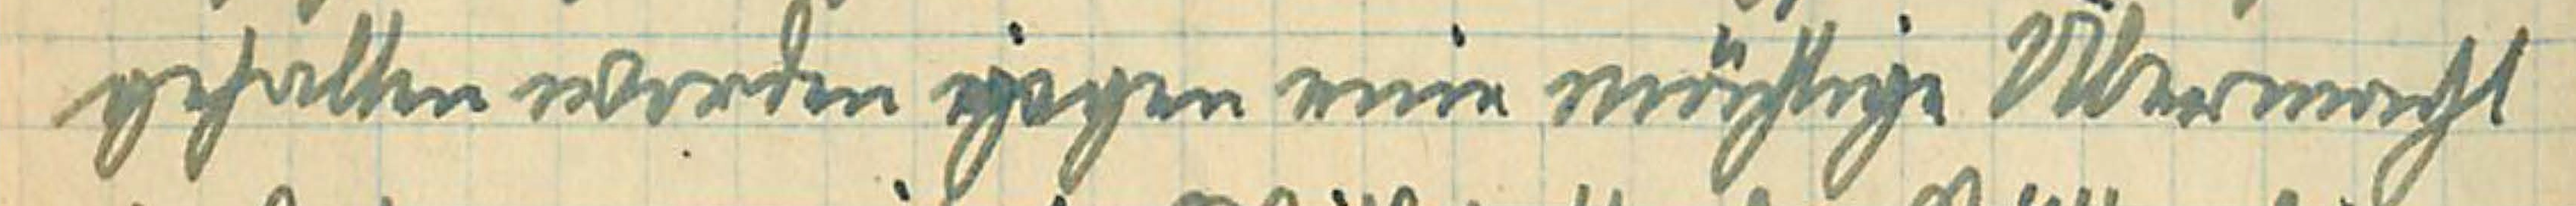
gehalten worden gegen eine mächtige Übermacht
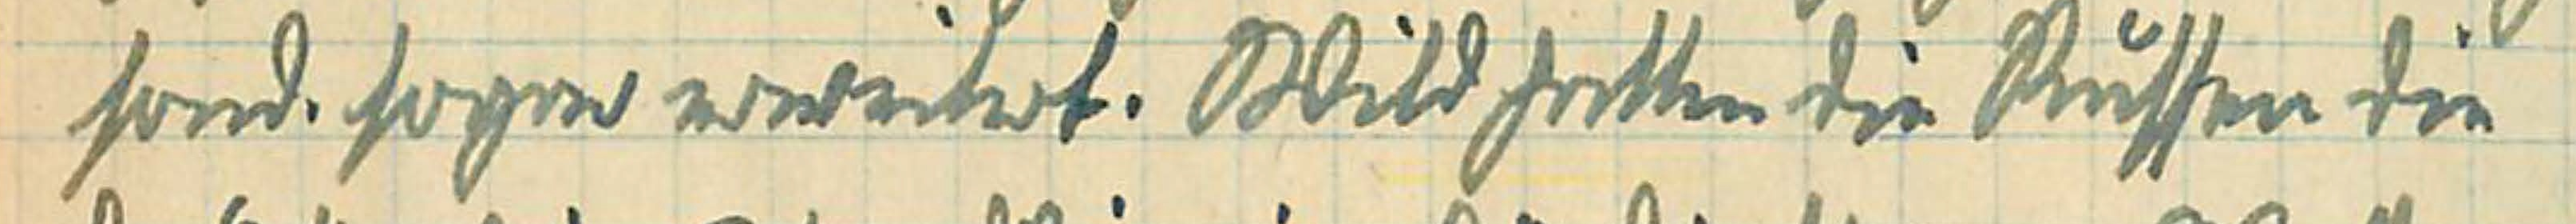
sond. sogar erweitert. Wild hatten die Russen die
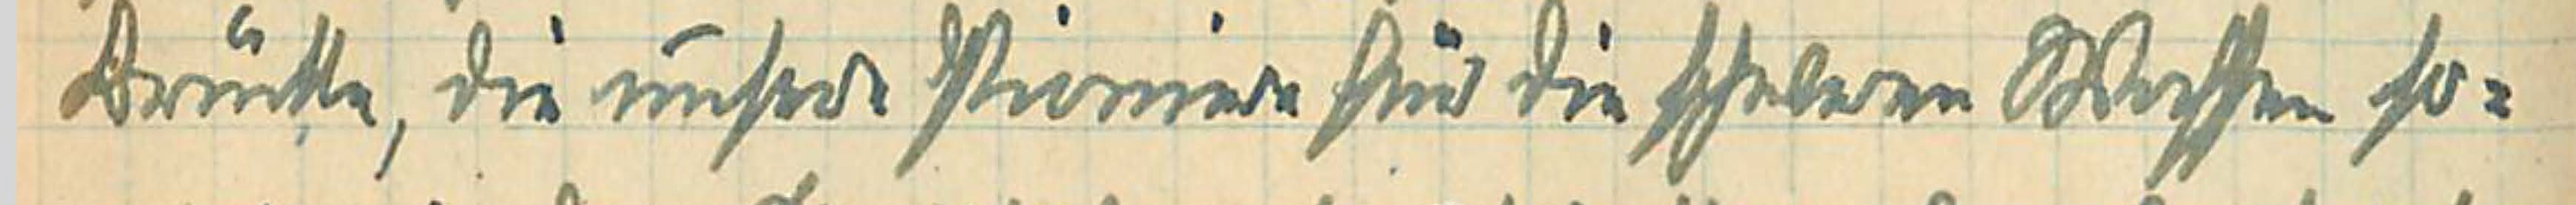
Brücke, die unsere Pioniere für die schweren Waffen so-
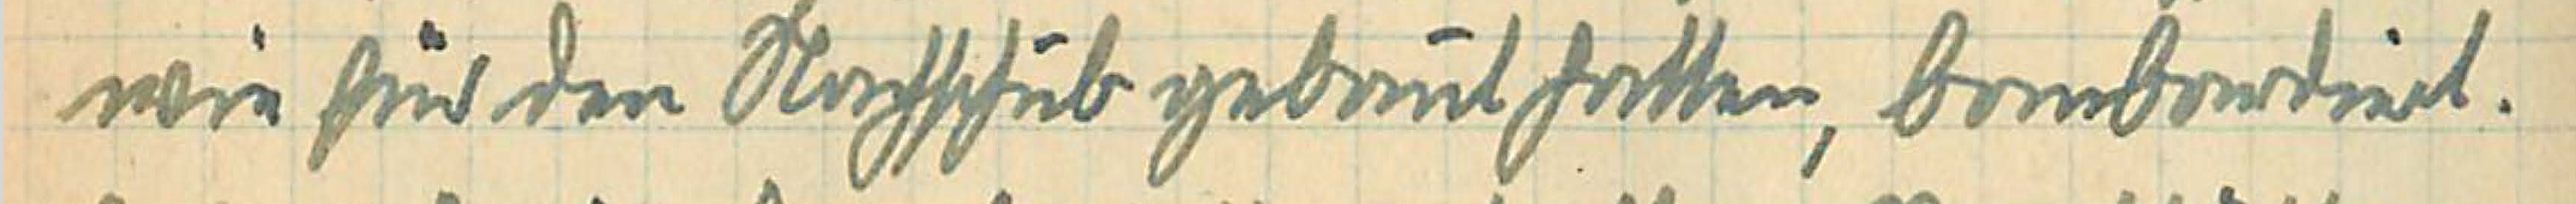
wie für den Nachschub gebaut hatten, bombardiert.
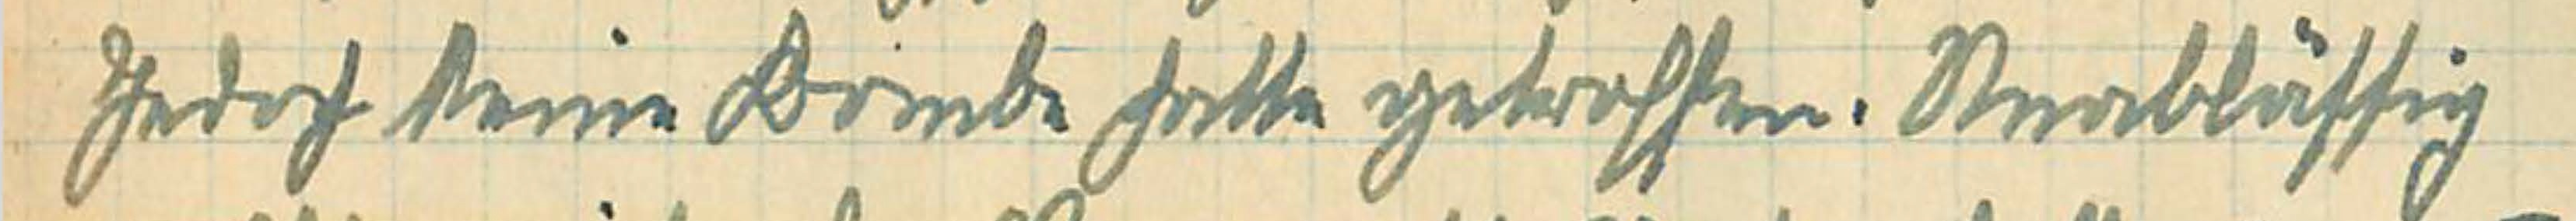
Jedoch keine Bombe hatte getroffen. Unablässig
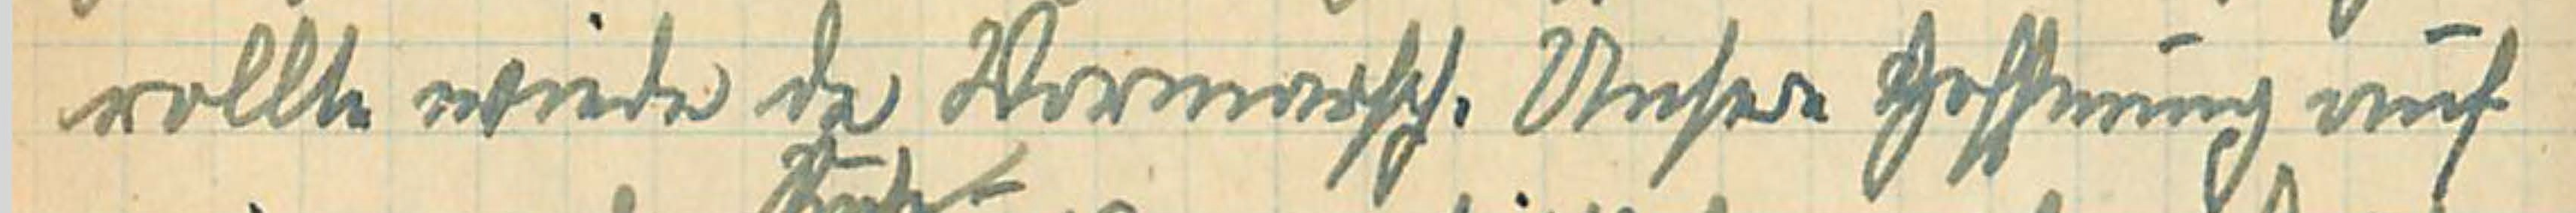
rollte wieder der Vormarsch. Unsere Hoffnung auf
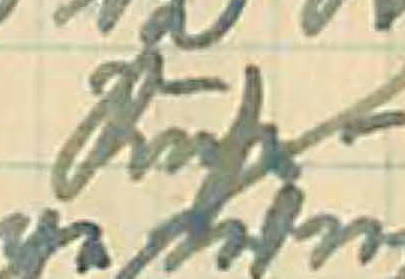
Ruhe
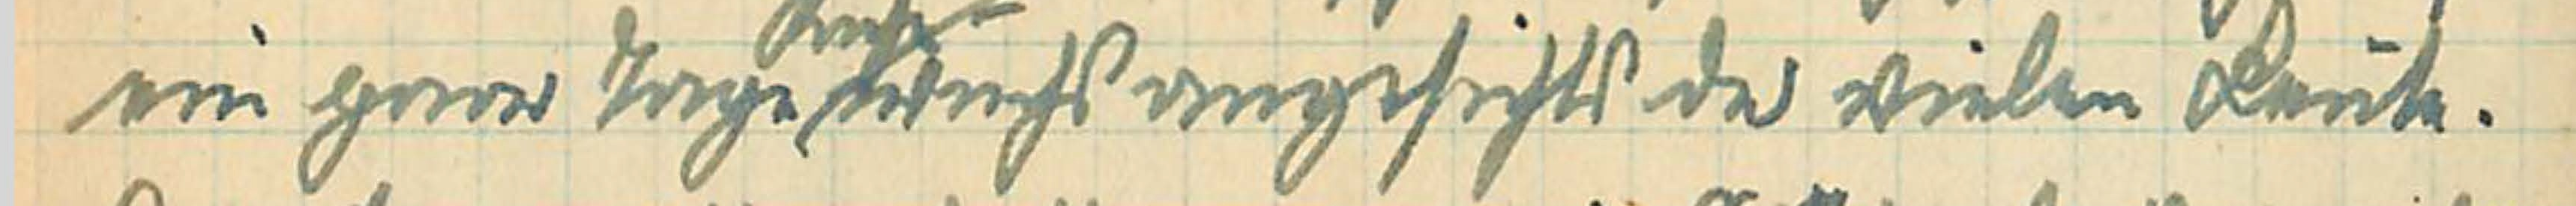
ein paar Tage wuchs angesichts der vielen Leute.
